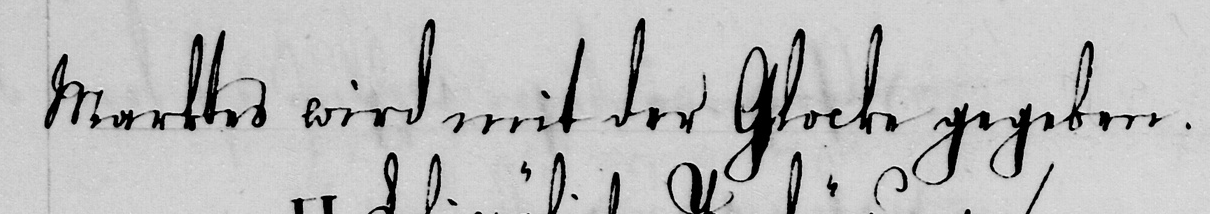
Marktes wird mit der Glocke gegeben.
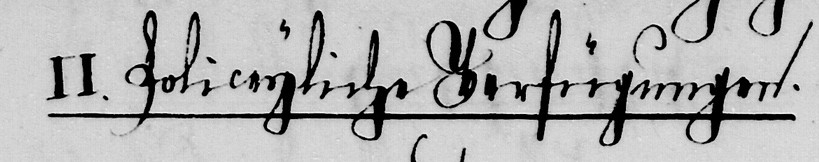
I. Policeyliche Verfügungen.
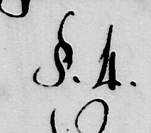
§. 4.
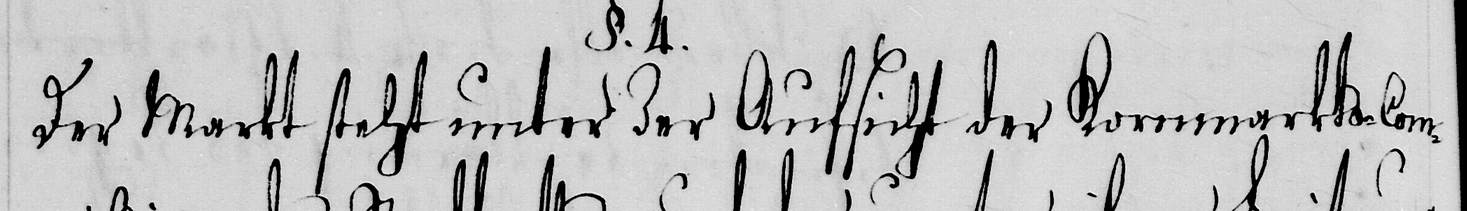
Der Markt steht unter der Aufsicht der Kornmarkts-Co¬
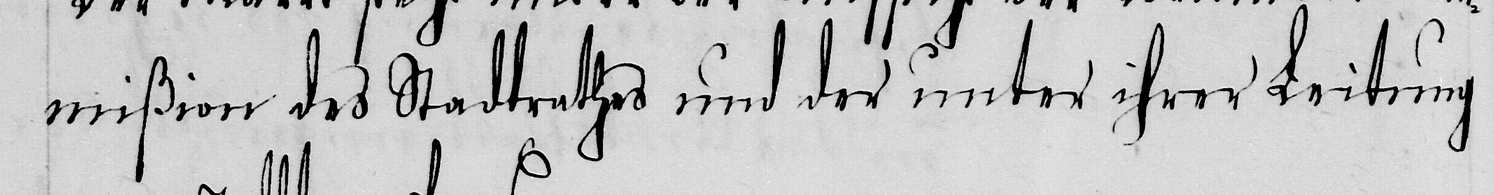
mmißion des Stadtrathes und der unter ihrer Leitung
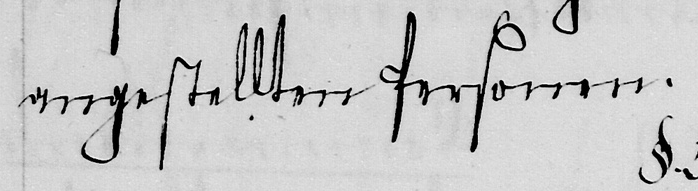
angestellten Personen.
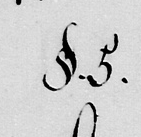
§. 5.
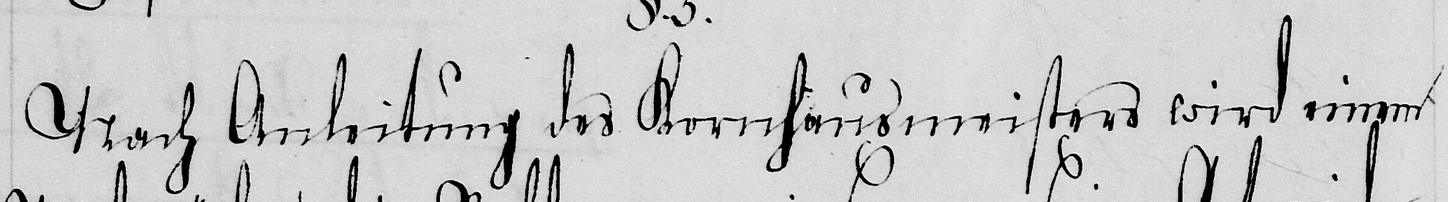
Nach Anleitung des Kornhausmeisters wird einem
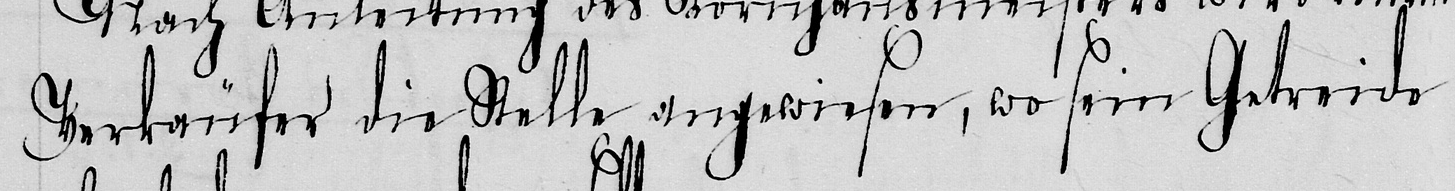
Verkäufer die Stelle angewiesen, wo sein Getreide
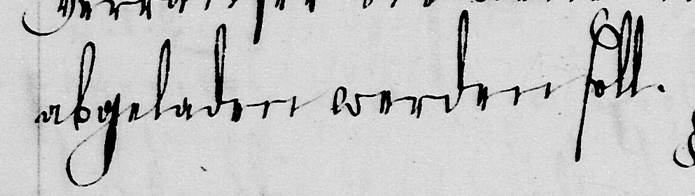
abgeladen werden soll.
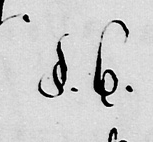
§. 6.
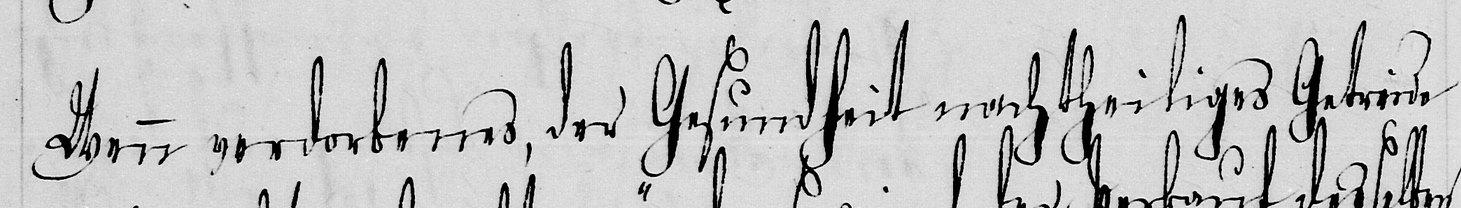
Wenn verdorbenes, der Gesundheit nachtheiliges Getrei¬
